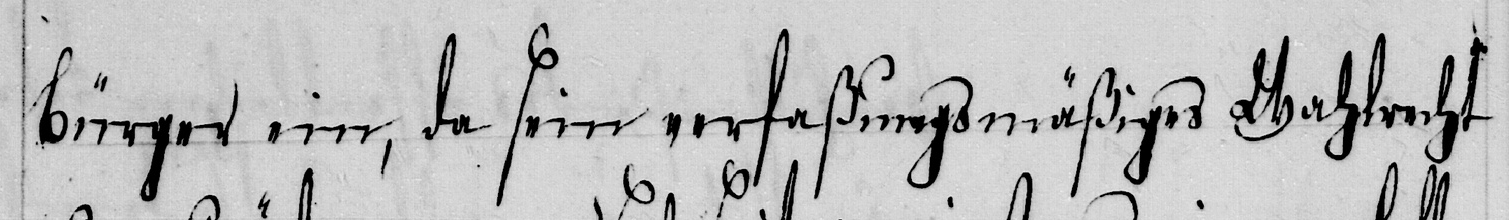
Bürger ein, da sein verfaßungsmäßiges Wahlrecht
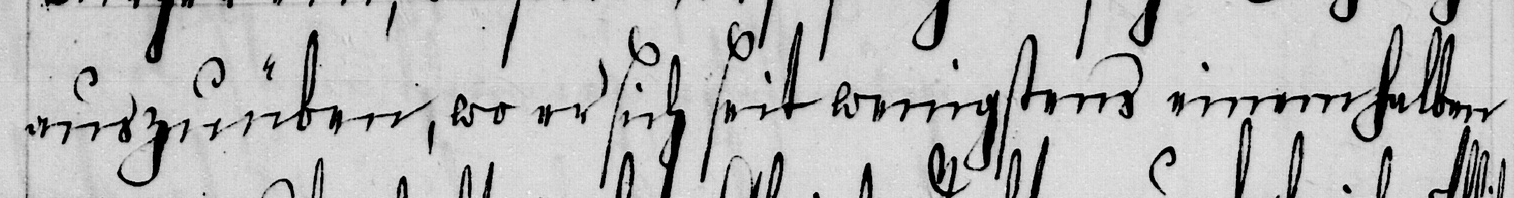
auszuüben, wo er sich seit wenigstens einem halben
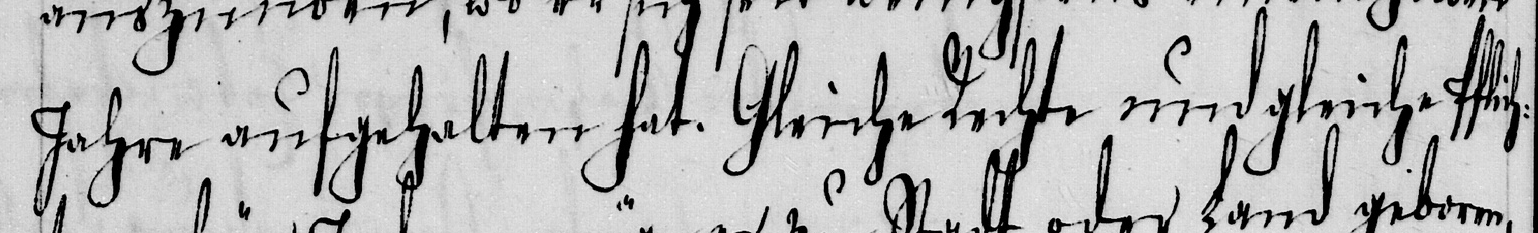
Jahre aufgehalten hat. Gleiche Rechte
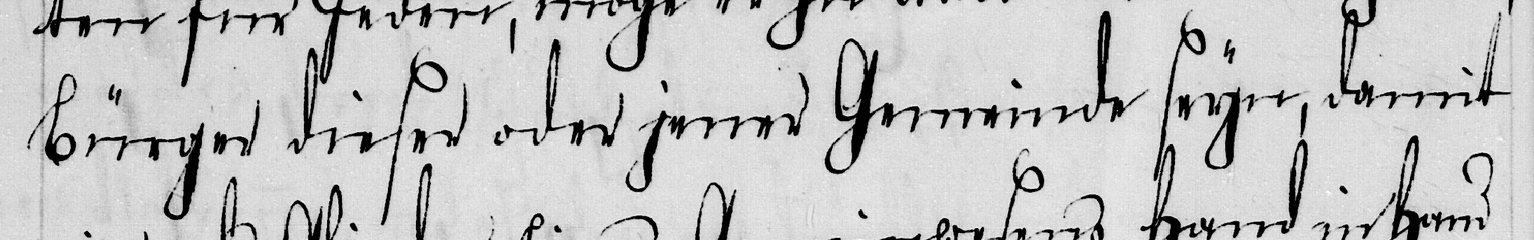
Bürger dieser oder jener Gemeinde seyn, damit
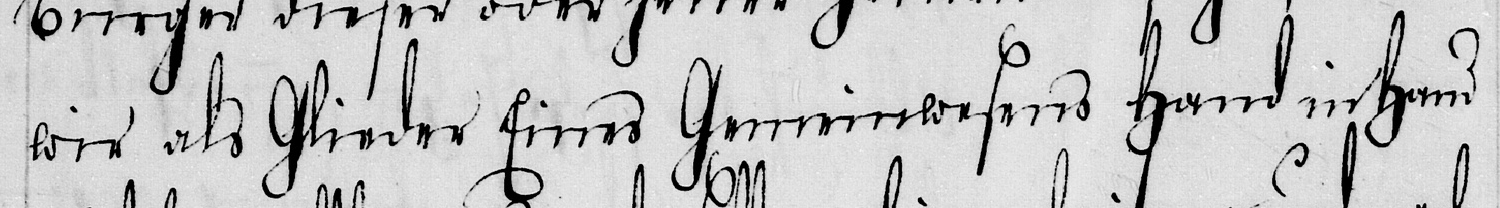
wir als Glieder Eines Gemeinwesens Hand in Hand
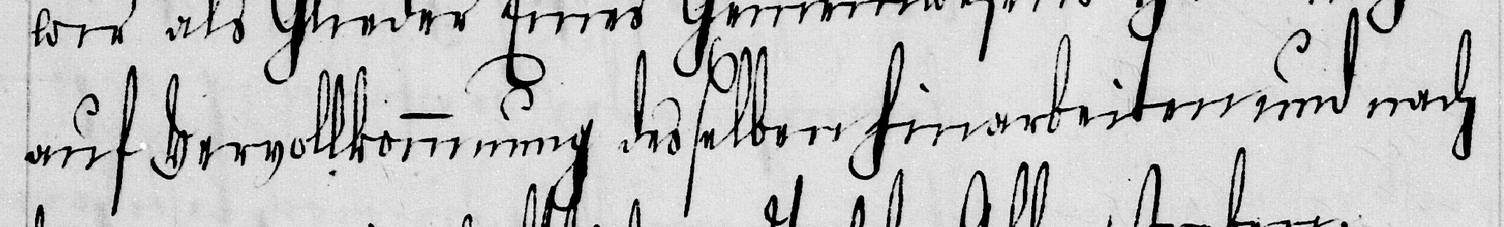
auf Vervollkommnung desselben hinarbeiten und nach
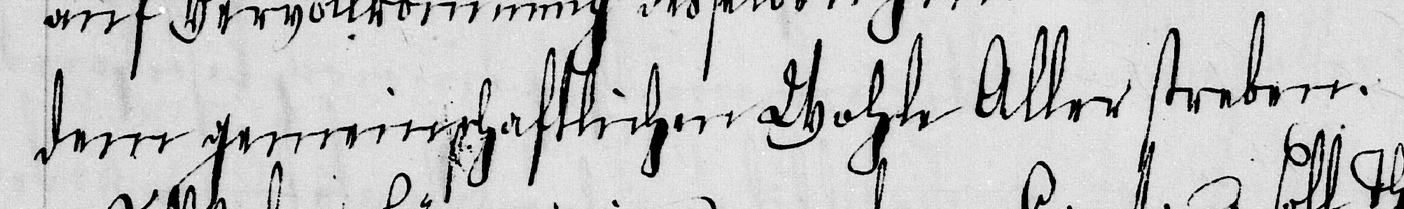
dem gemeinschaftlichen Wohle Aller streben.
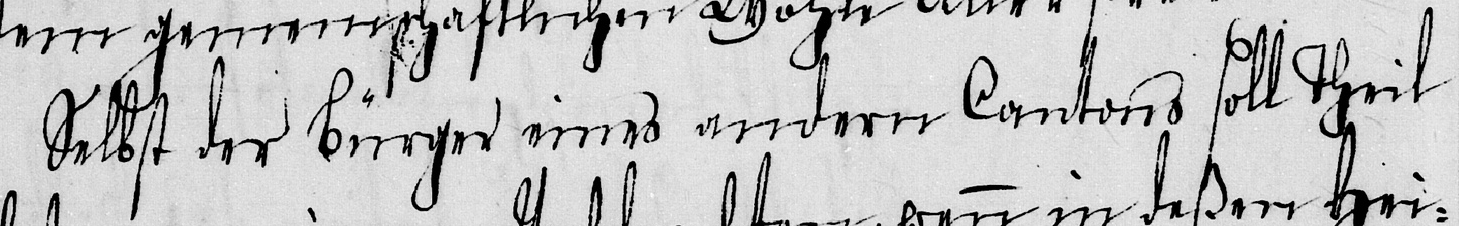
Selbst der Bürger eines andern Cantons soll Theil
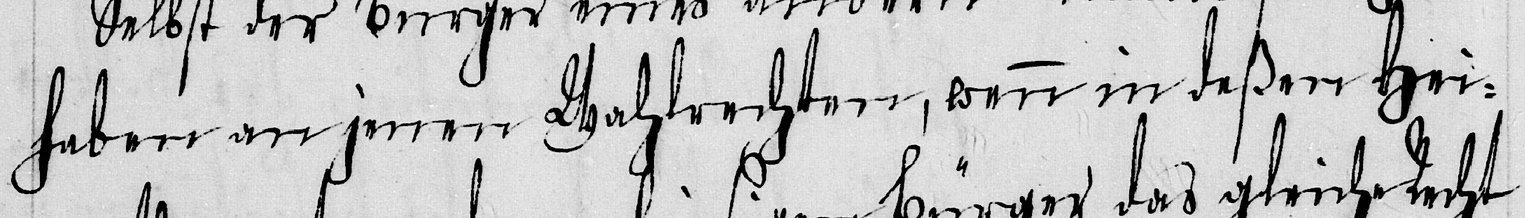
haben an jenen Wahlrechten, wenn in deßen Hei¬
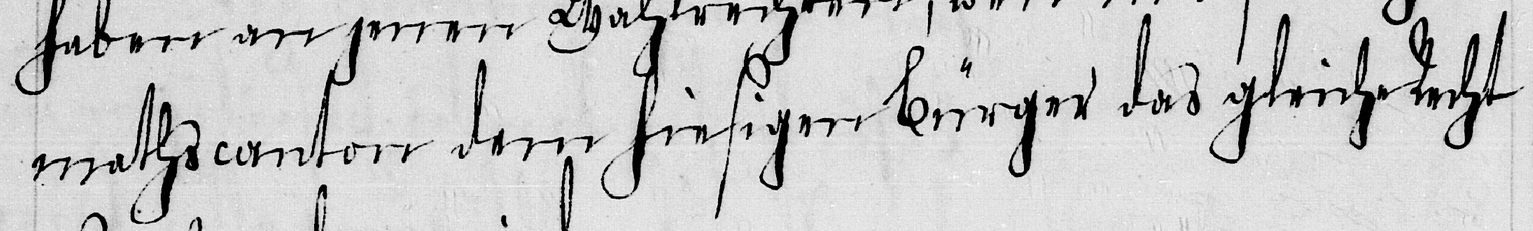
mathscanton dem hiesigen Bürger das gleiche Recht
